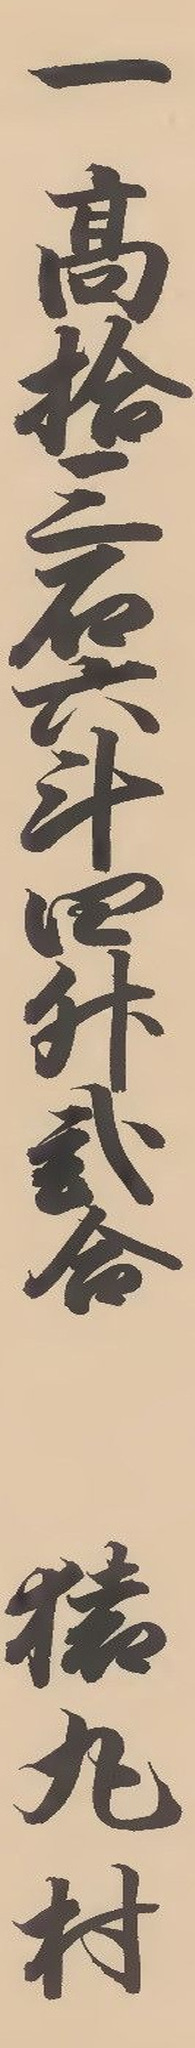一高拾三石六斗四升弐合猿丸村
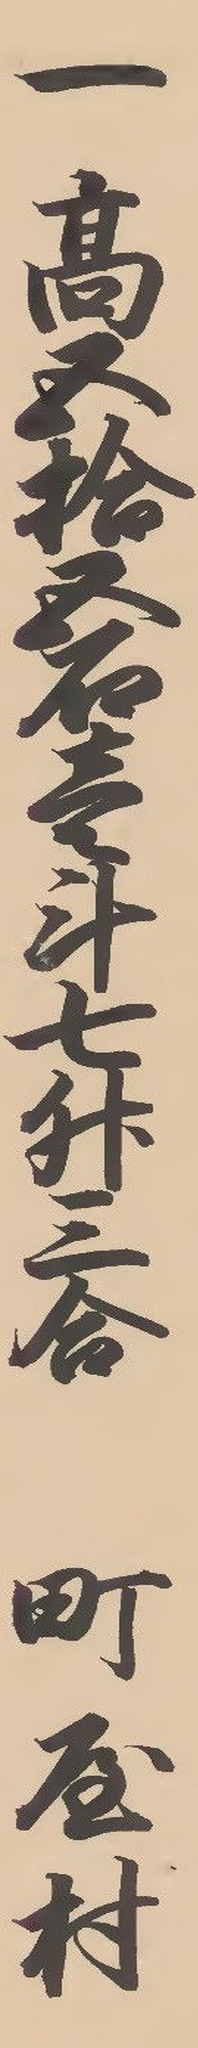一高五拾五石壱斗七升三合町屋村
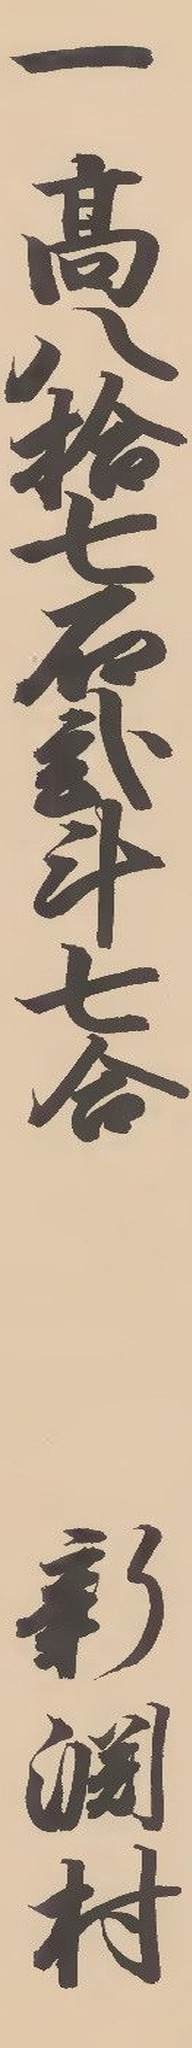一高八拾七石弐斗七合新渕村
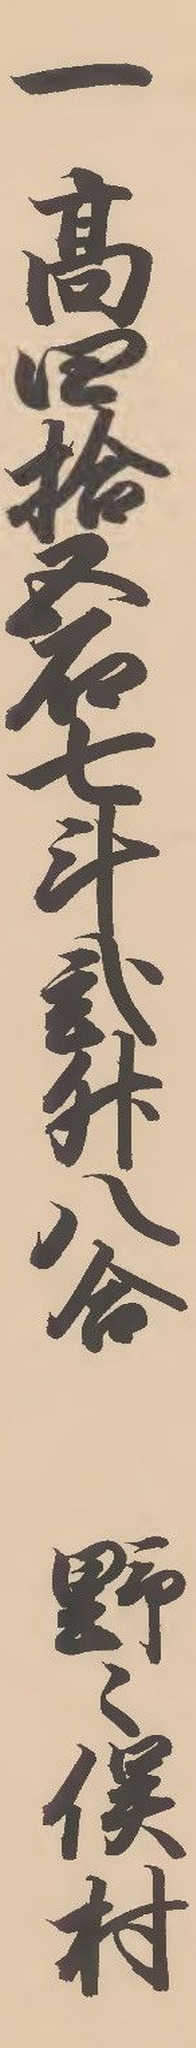一高四拾五石七斗弐升八合野々俣村
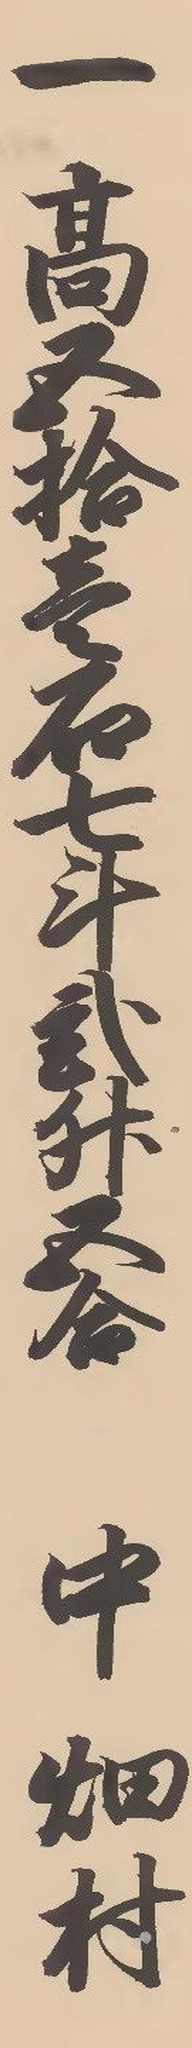一高五拾壱石七斗弐升五合中畑村
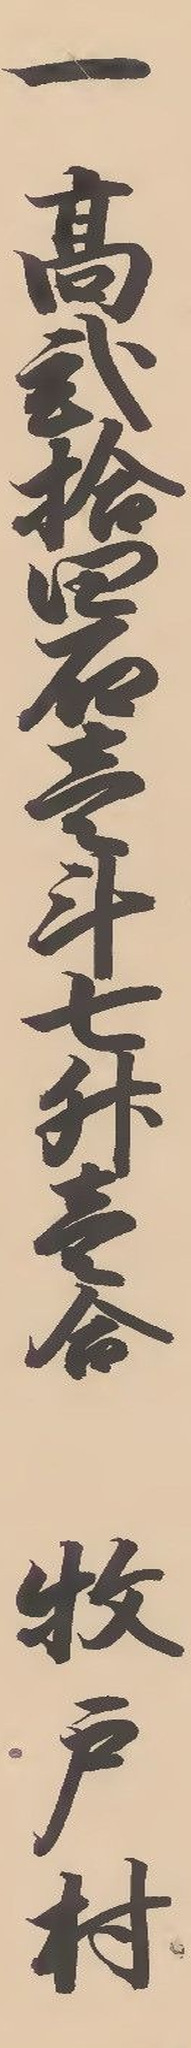一高弐拾四石壱斗七升壱合牧戸村

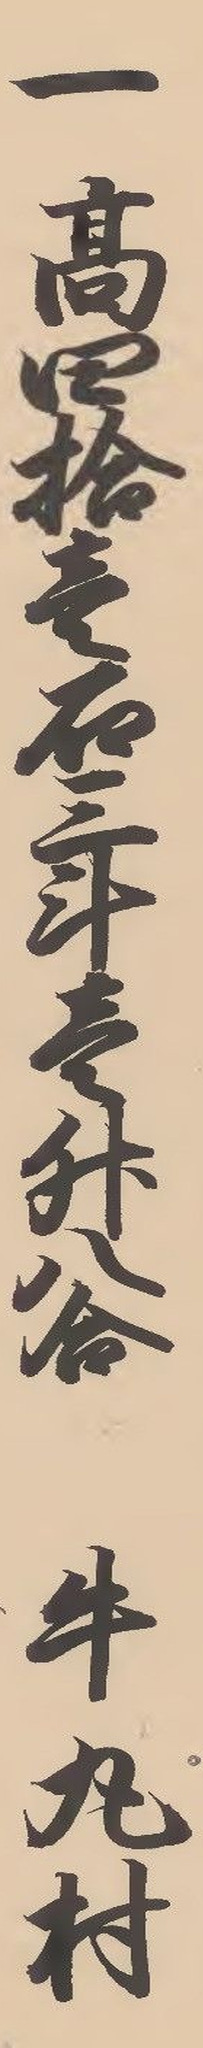一高四拾壱石三斗壱升八合牛丸村
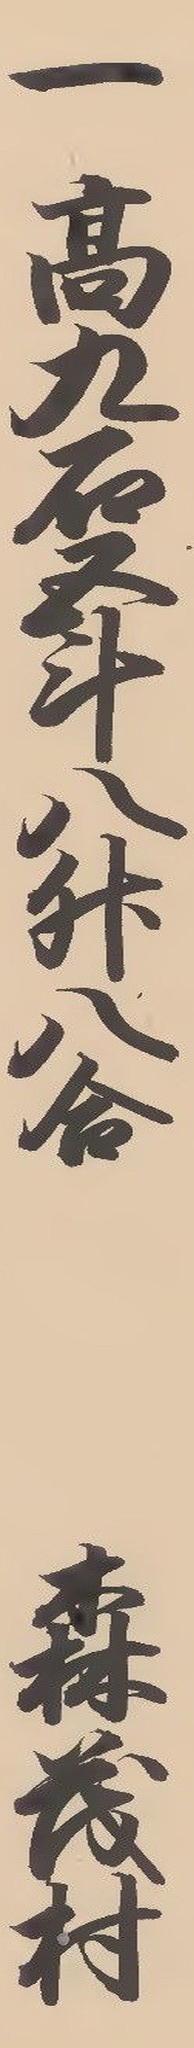一高九石五斗八升八合森茂村
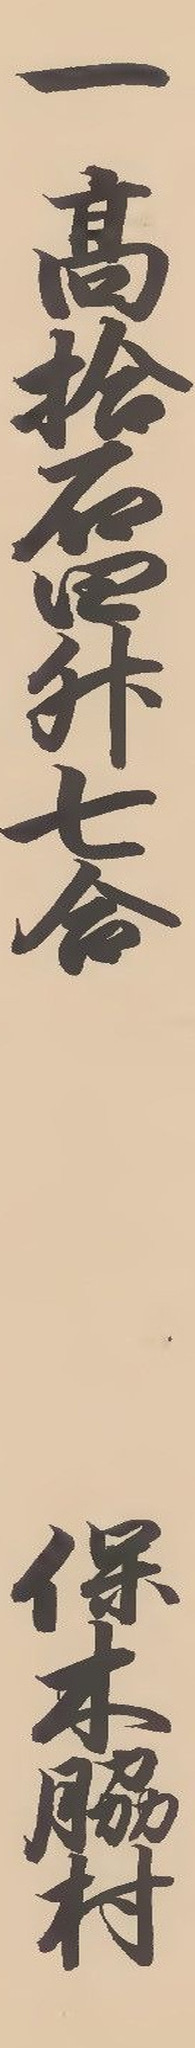一高拾石四升七合保木脇村
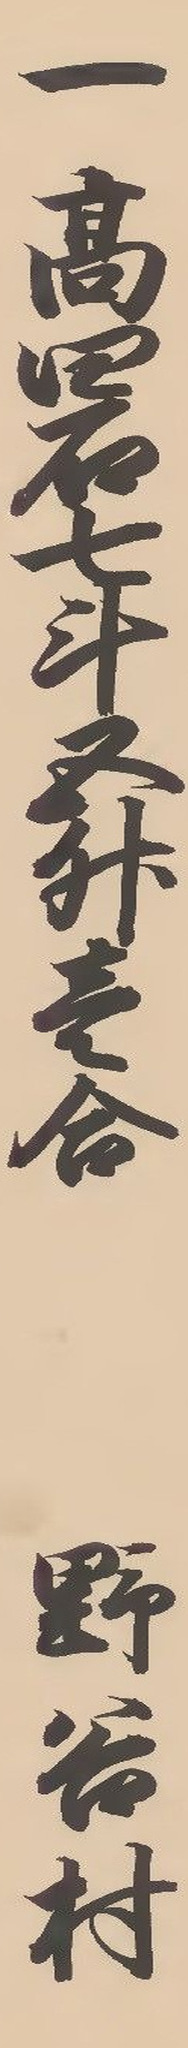一高四石七斗五升壱合野谷村
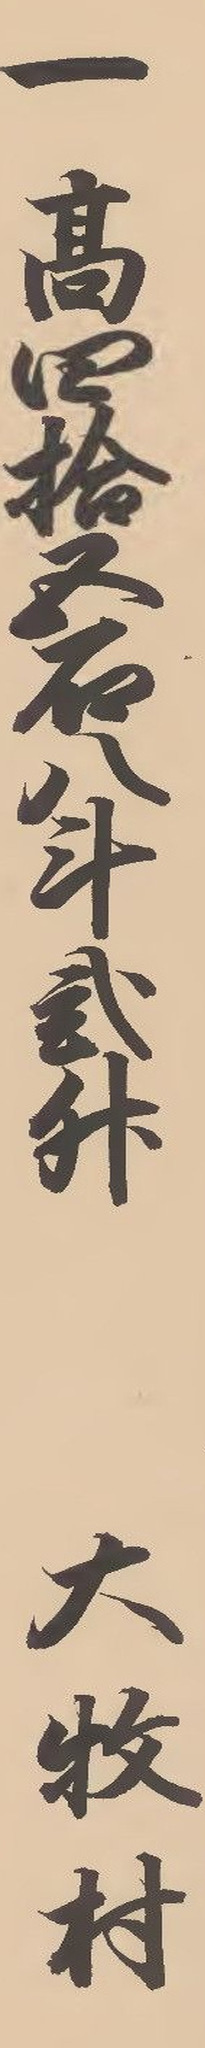一高四拾五石八斗弐升大牧村
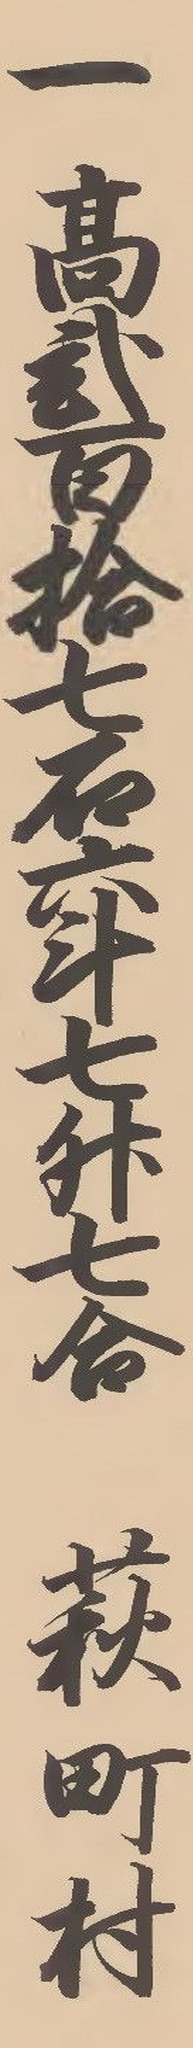一高弐百拾七石六斗七升七合萩町村
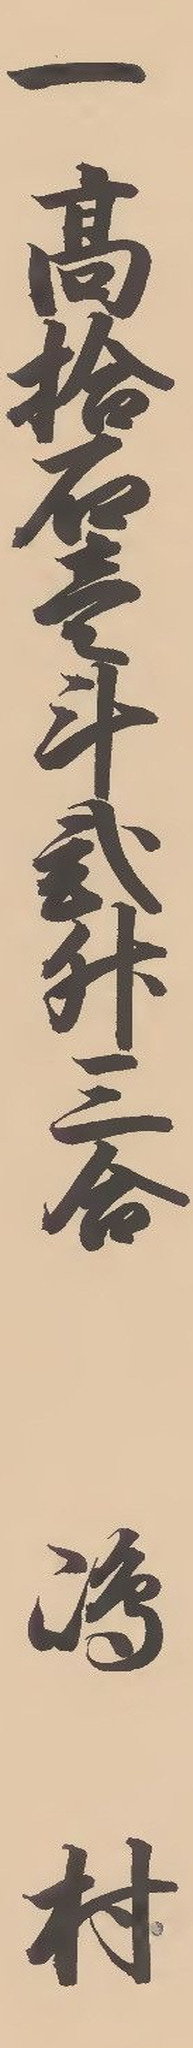一高拾石壱斗弐升三合島村
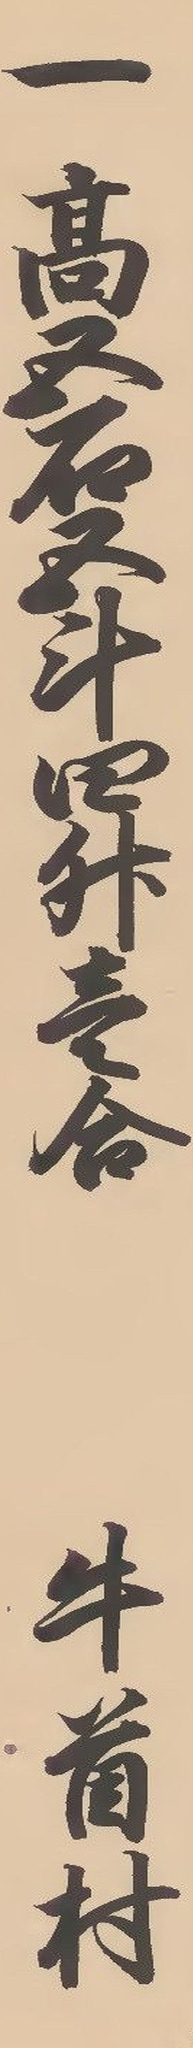一高五石五斗四升壱合牛首村

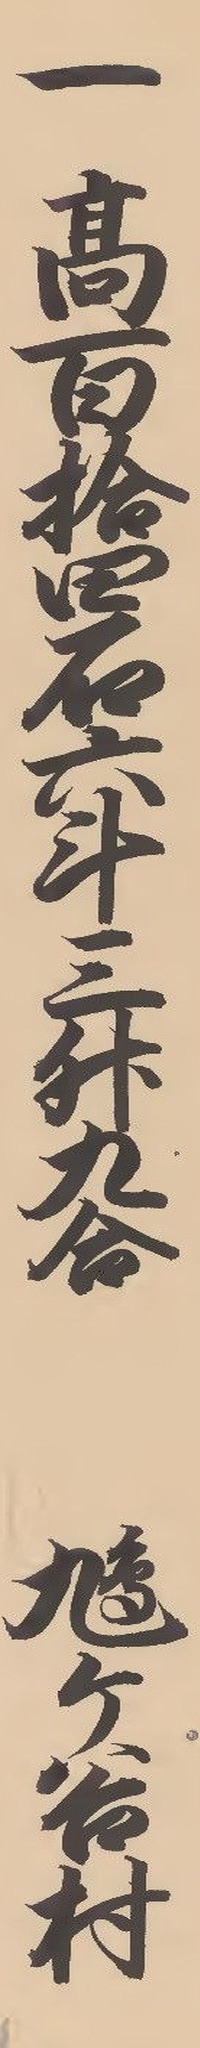一高百拾四石六斗三升九合鳩ヶ谷村
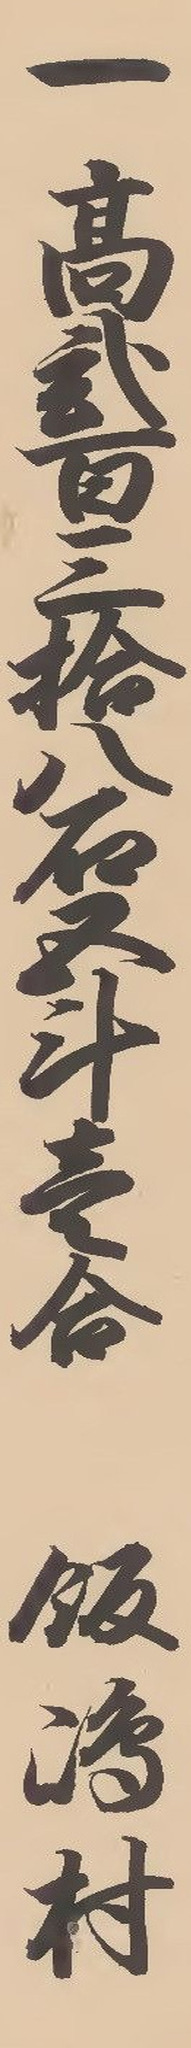一高弐百三拾八石五斗壱合飯島村
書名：飛騨国郷帳
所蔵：国立公文書館 National Archives of Japan
